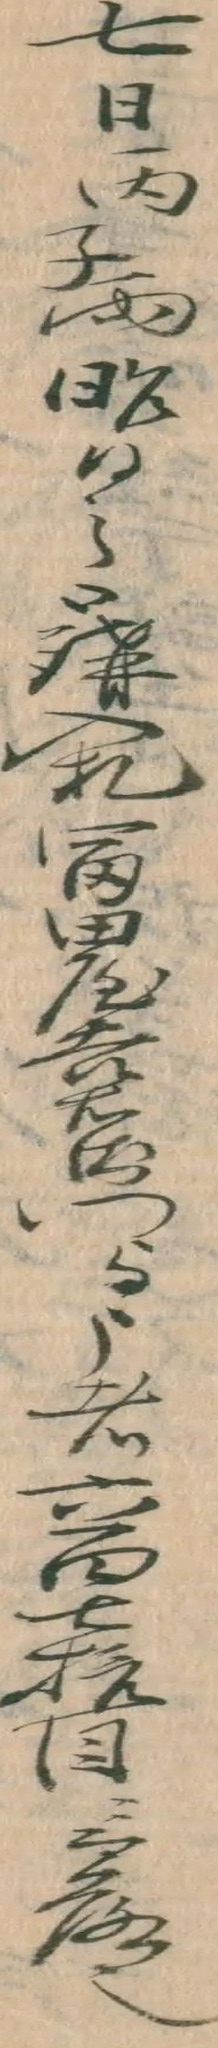七日丙子雨昨日之御講入札富田屋吉右衛門と申者六百七拾目に而落也
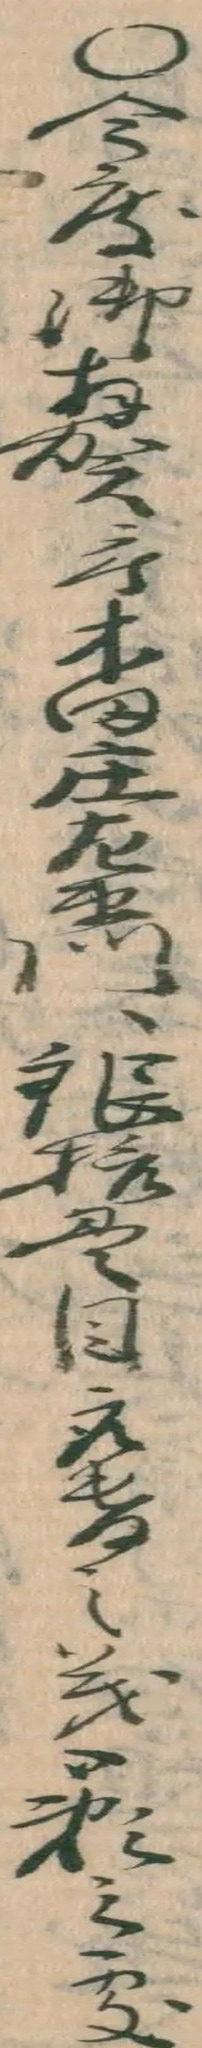○今度御拝賀ニ付木田庄左衛門へ銀拾貫目取替之義御頼之處
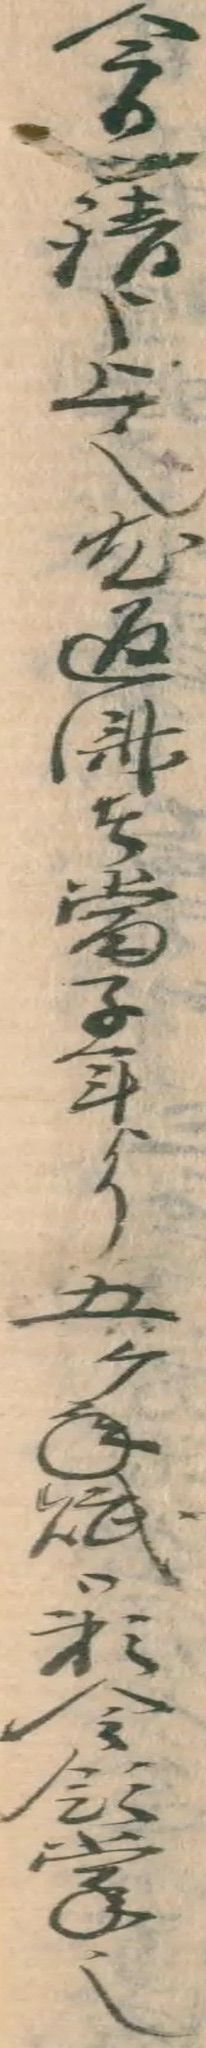今日御請申上也尤返済者當子年より五ヶ年賦御頼令領掌也
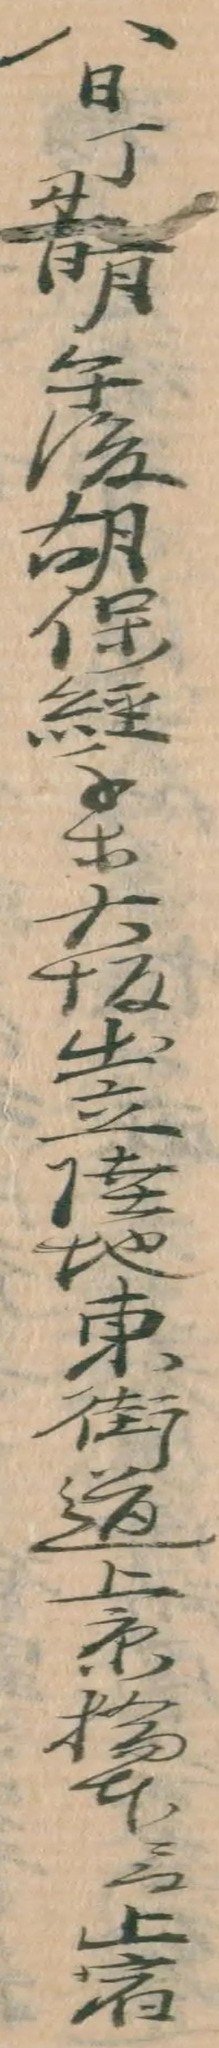八日丁丑晴午後胡保経千等大坂出立陸地東街道上京橋本ニ而止宿
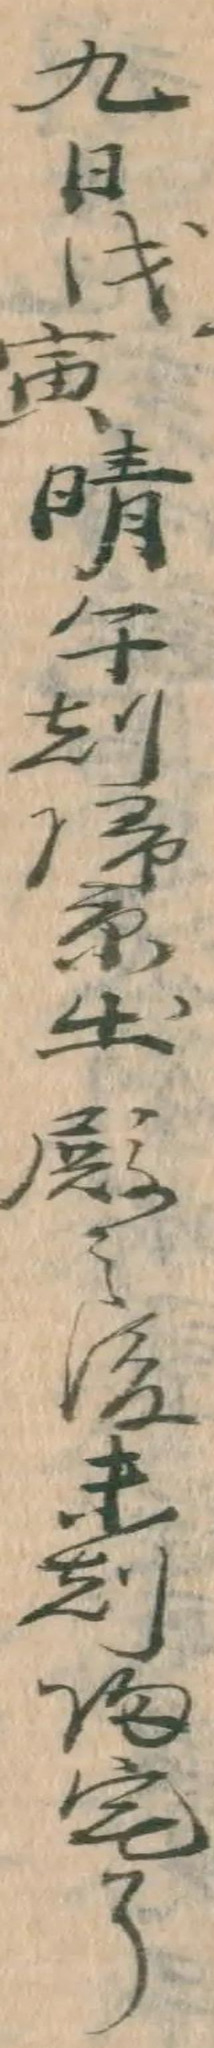九日戊寅晴午刻帰京出殿之後未刻帰宅了
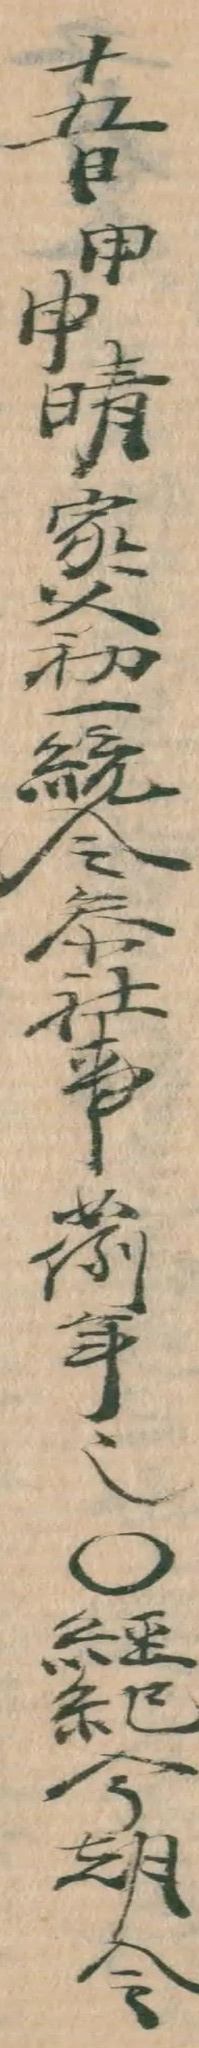十五日甲申晴家父初一統令参社事如例年也○経紀今朝令
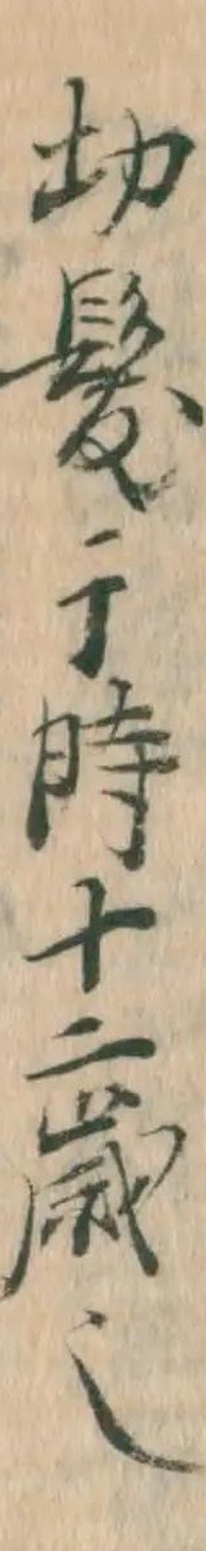切髪于時十二歳也
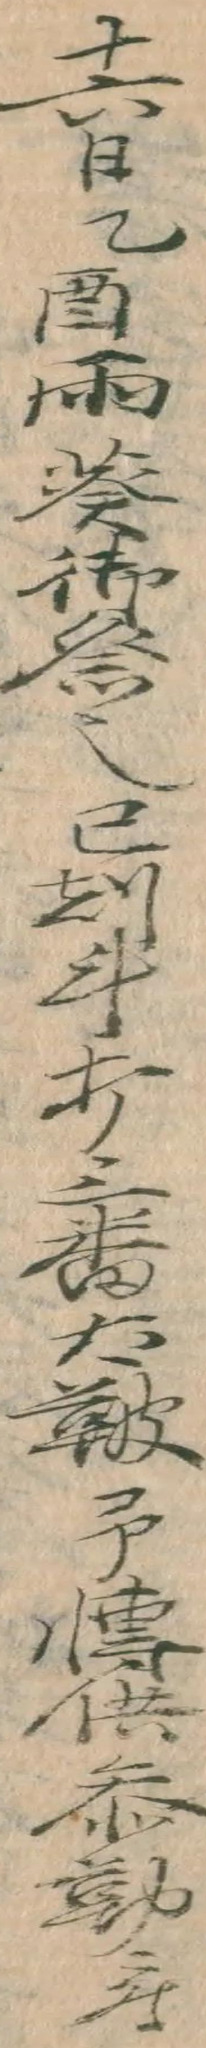十六日乙酉雨葵御祭也巳刻斗打三番太鼓予轉供参勤ニ付
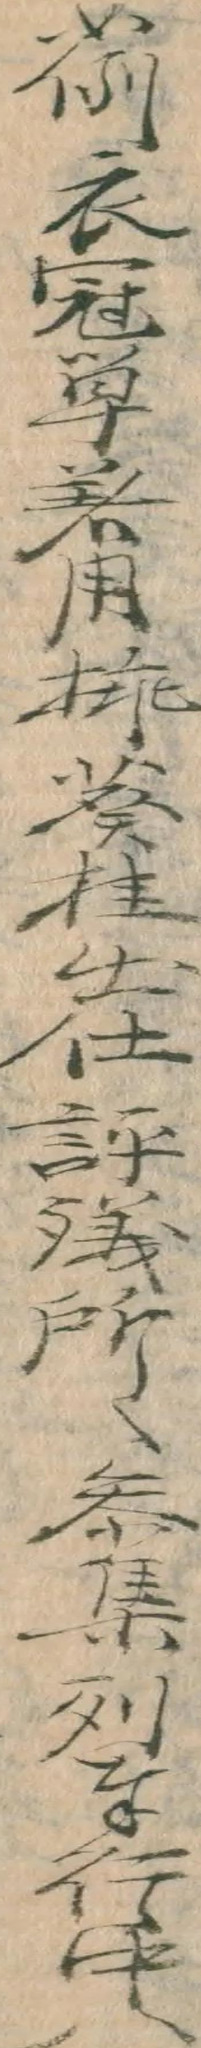如例衣冠単着用挿葵桂出仕評議所へ参集列奉行中へ
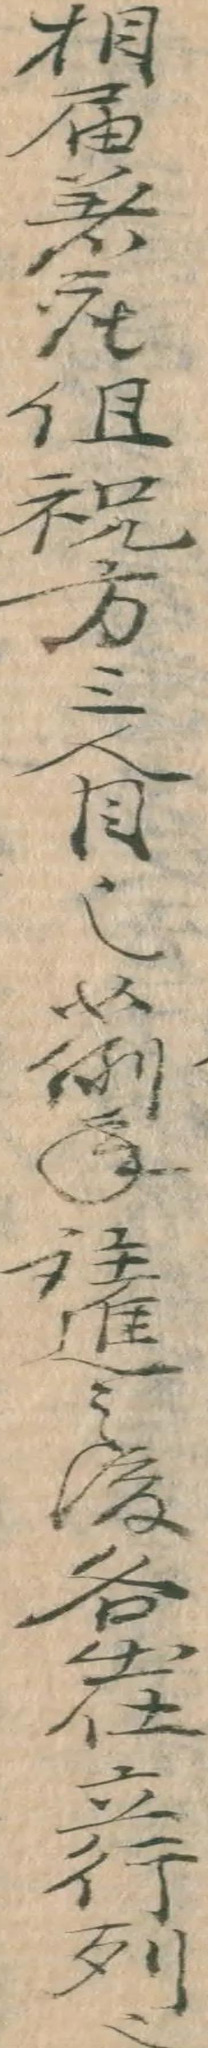相届着座但祝方三人目也御例年注進之後各出仕立行列也
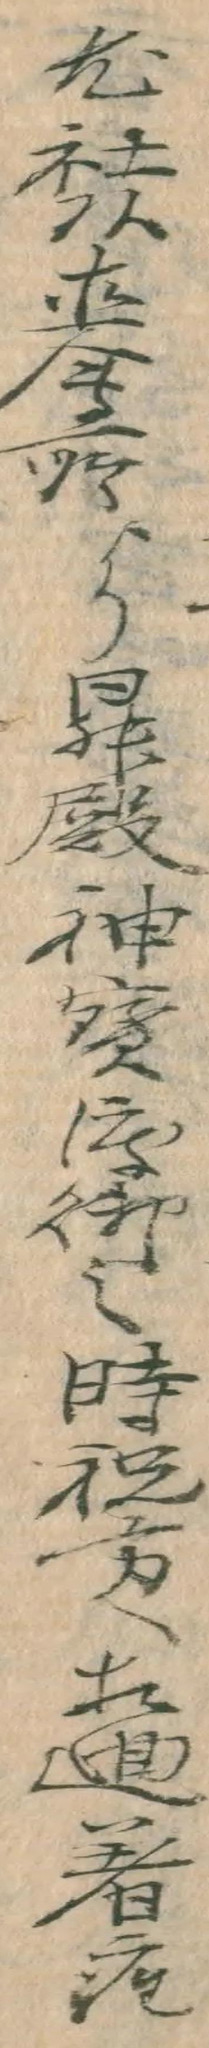尤社頭直會所より昇殿神寶渡御之時祝方へ相廻着座
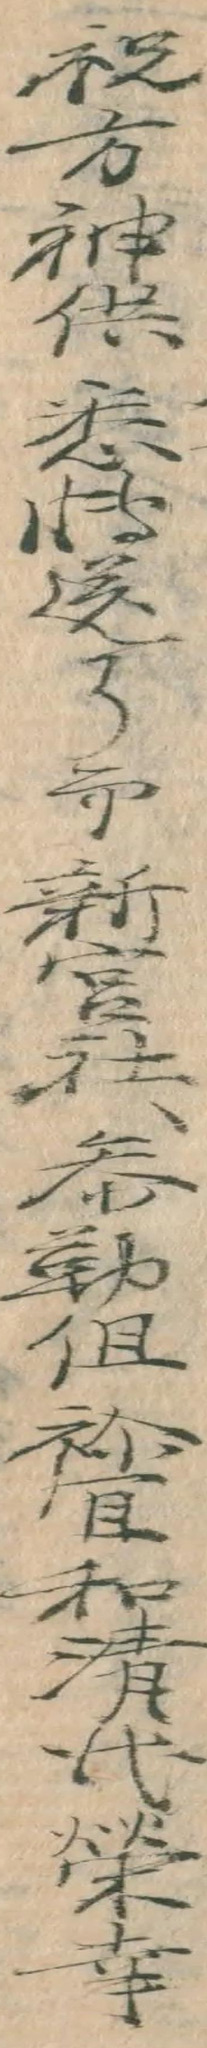祝方神供悉轉送了而新宮社ヘ参勤但祢宜和清代榮幸
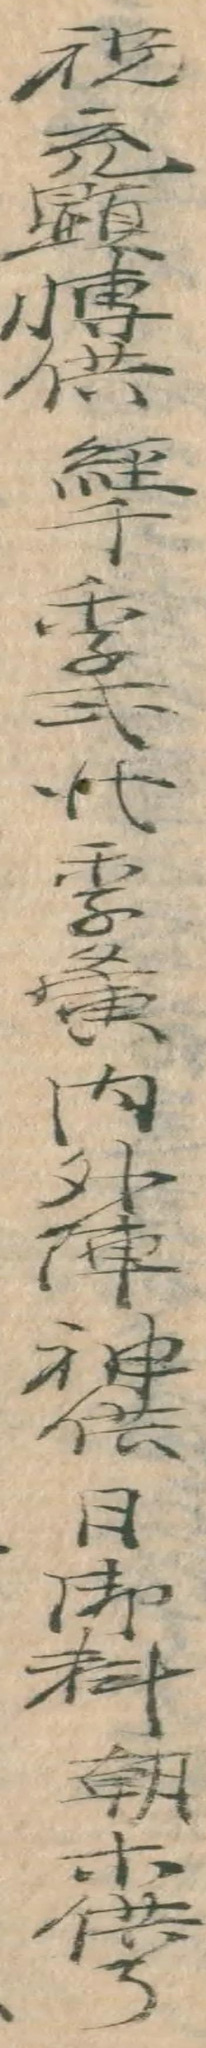祝充顕傳供経千季式代季夤内外陣神供日御科朝等供了
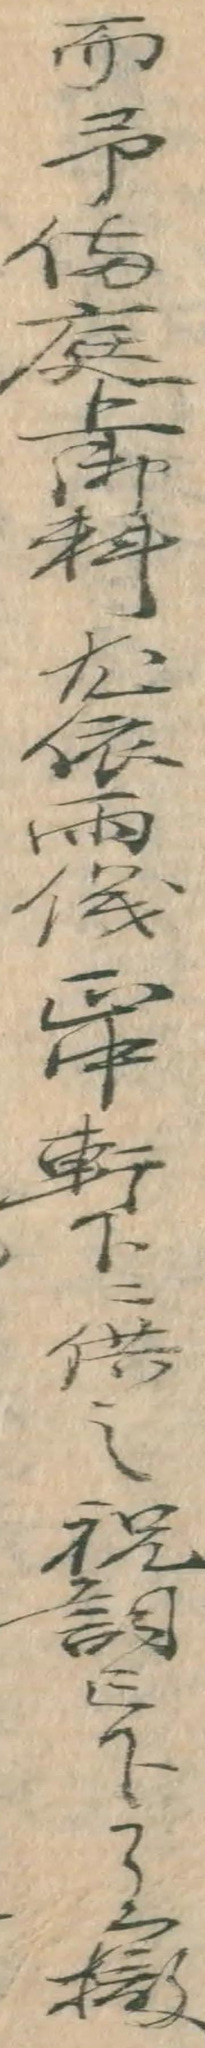而予備庭上御料尤依雨儀正中軒下ニ供之祝詞已下了而撤
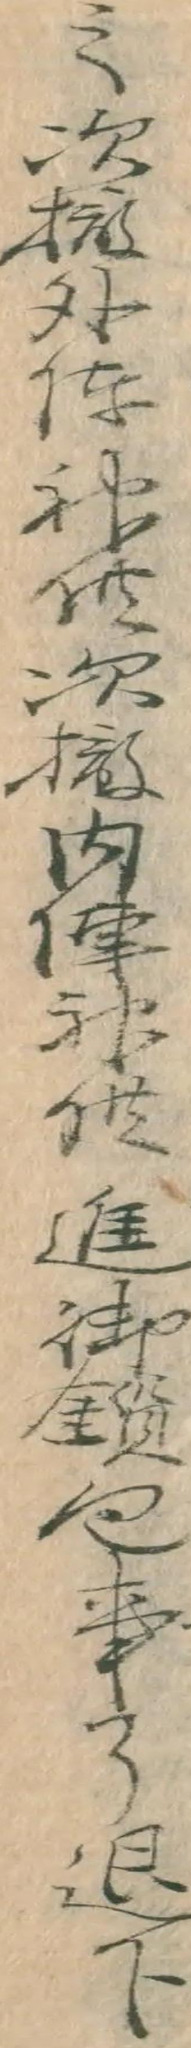之次権外陣神供次撤内陣神供進御鎖包事了退下

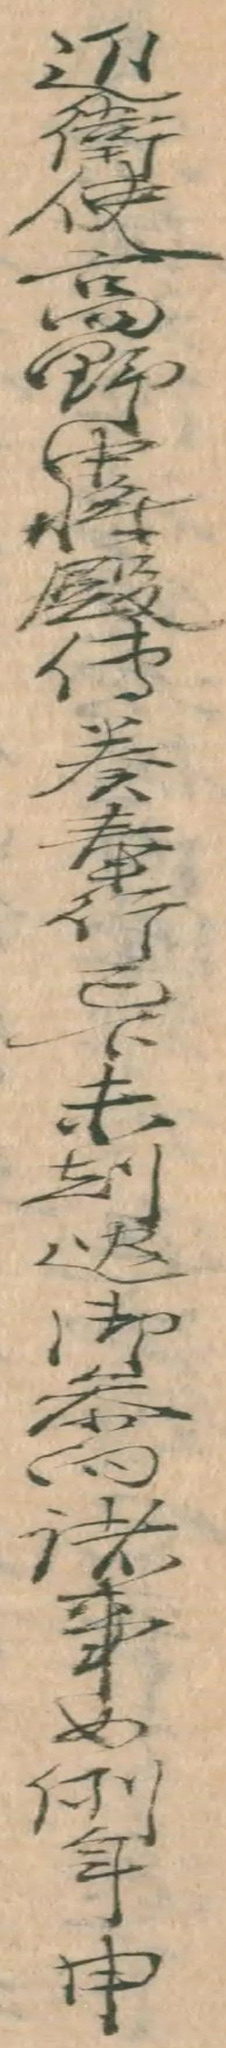近衛使高野中将殿傳奏奉行已下未刻邊御参向諸事如例年申
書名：賀茂社記録. 第65冊
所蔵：国立国会図書館 National Diet Library, JAPAN
